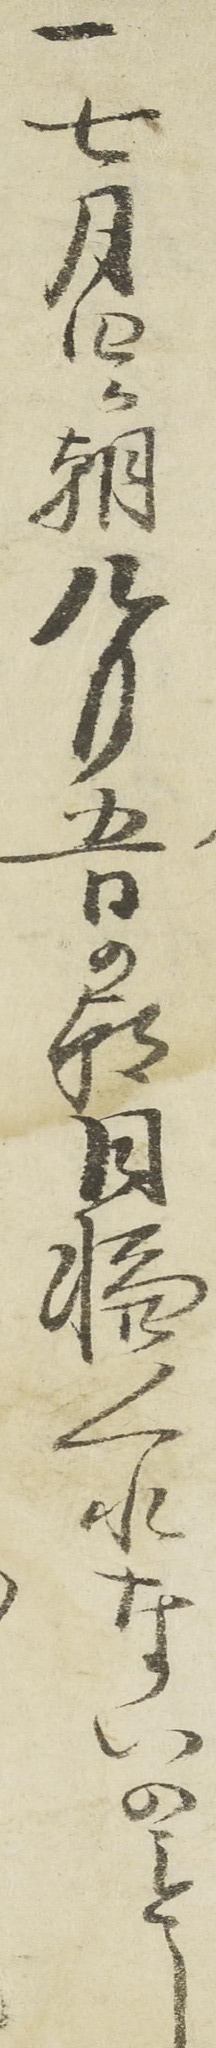一七月四日朝八月五日の朝日輪くれないのことし
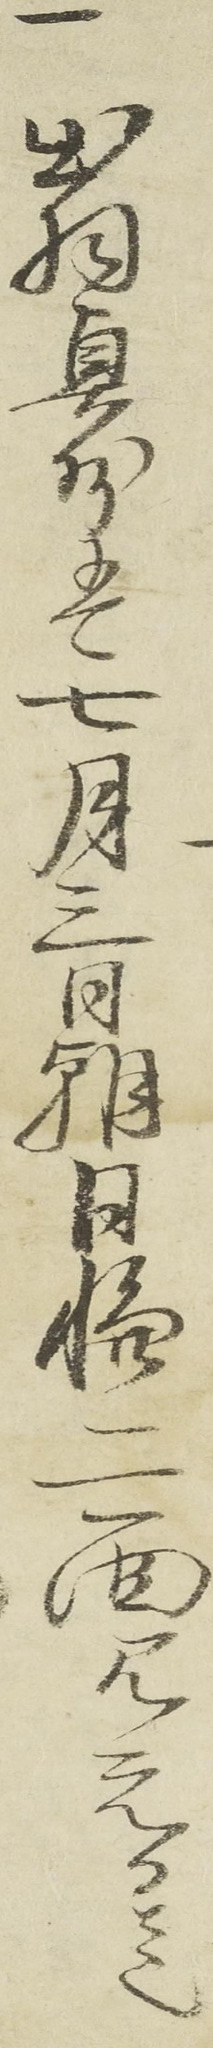一出羽奥州にて七月三日朝日輪二面見えると也
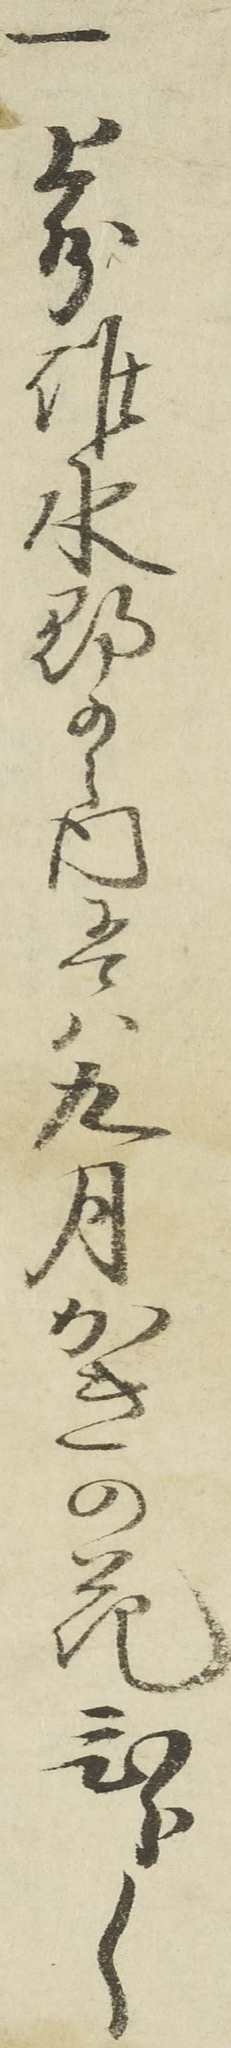一上州碓井郡の内にてハ九月かきの花ひら〳〵
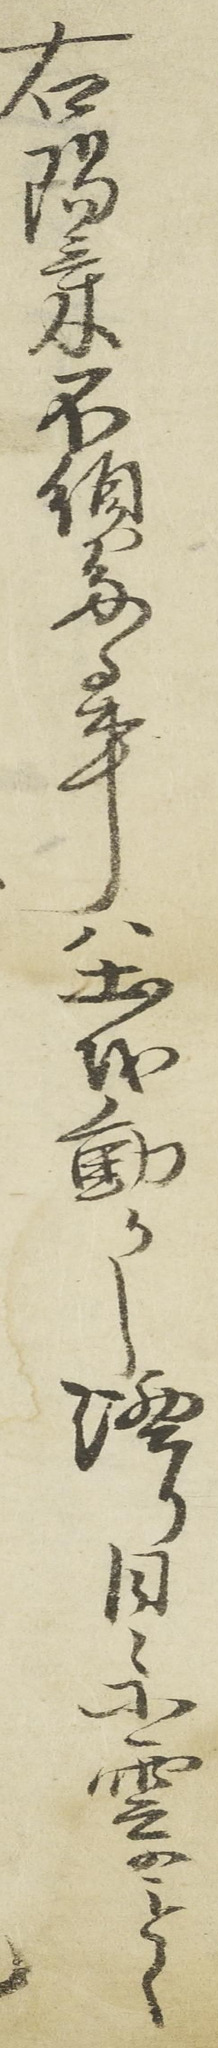右陽気不調なる事ハ土を動かし煙り日々に雲のことく
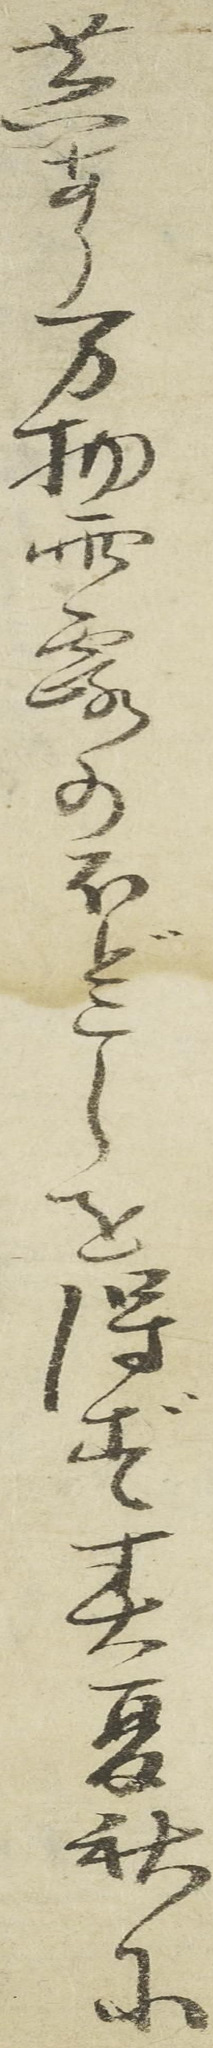黄あり万物雨露のほどこしを得ず春夏秋に
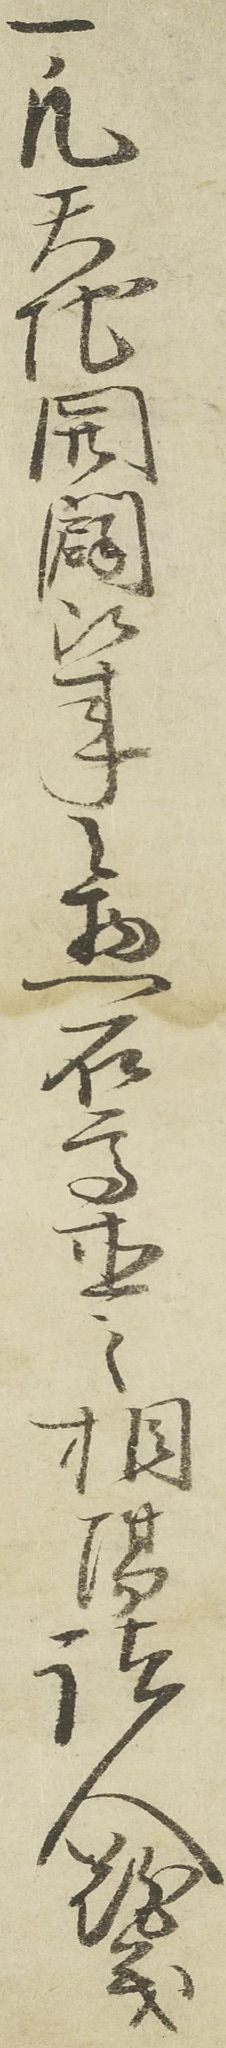一凡天地開闢以来の惣石高直の相場諸人難義
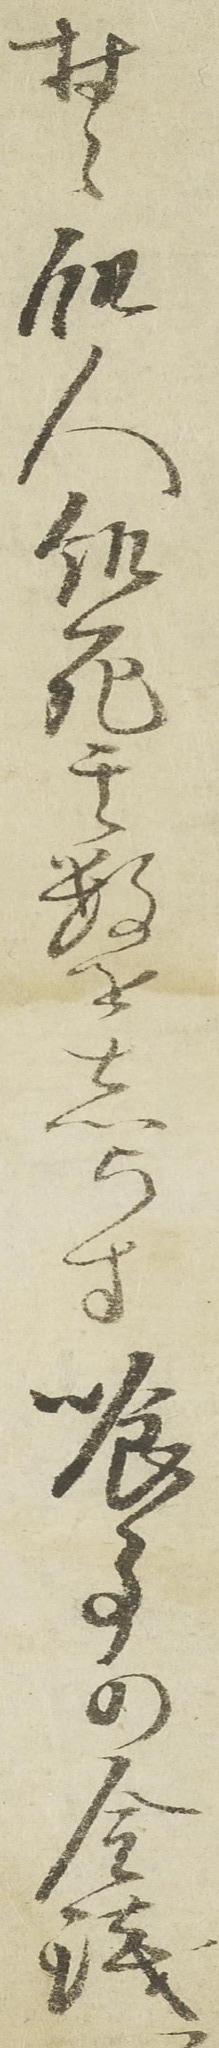村々領人飢死其数をしらす喰事の金銭ニ
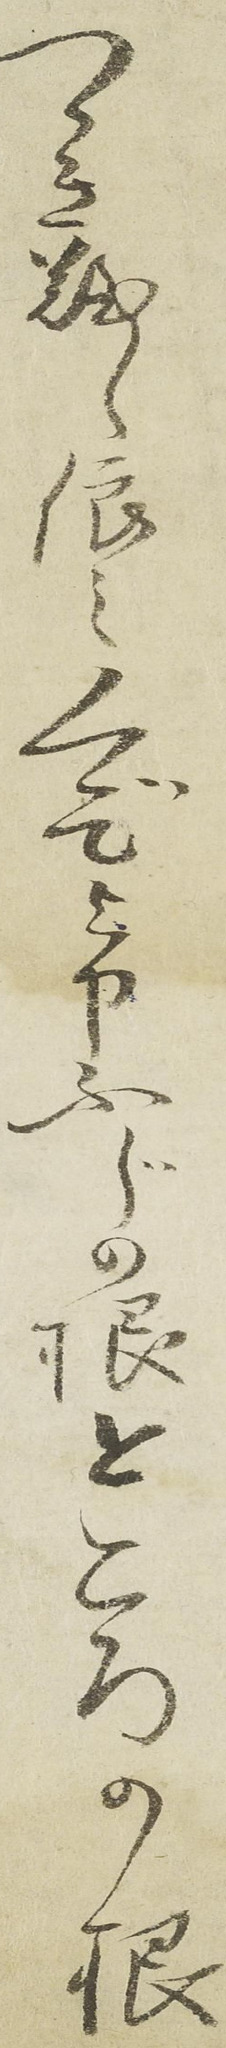つき難し依之くぞと申ふじの根ととろの根
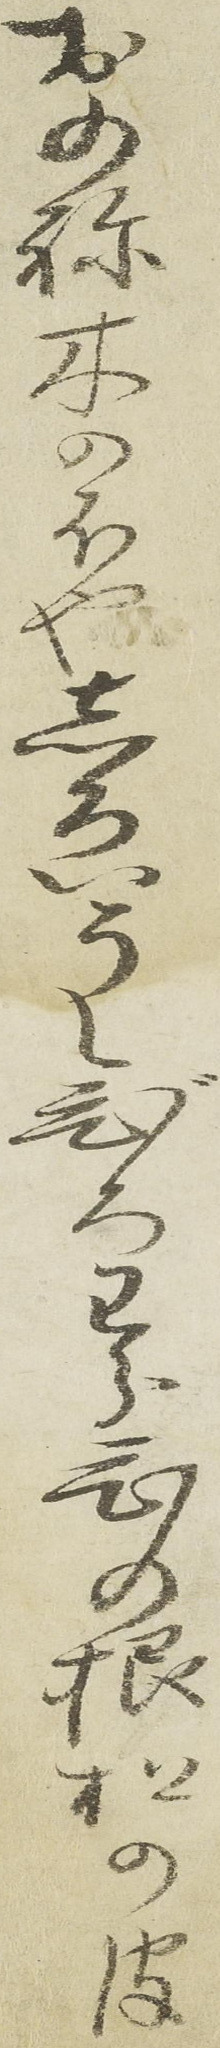おのねきのほやしろいうしびろわらひの根松の皮
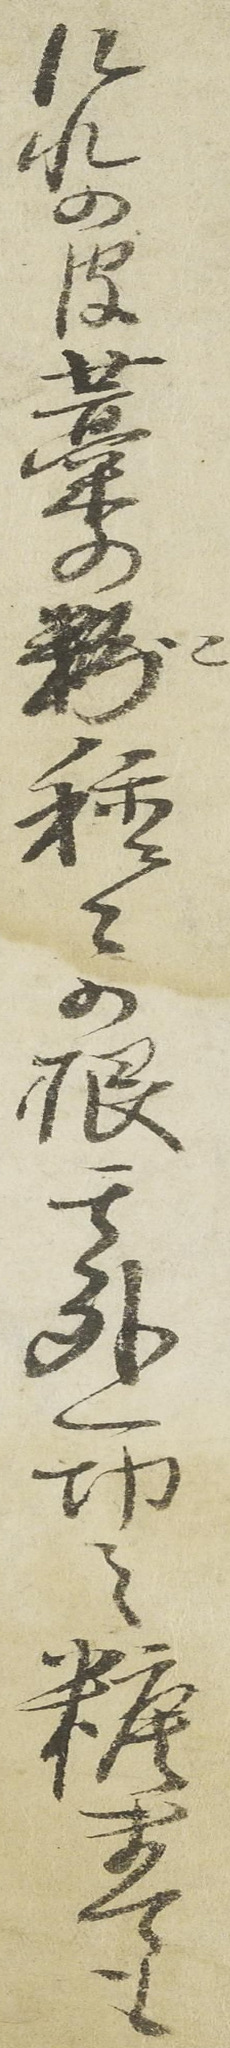けれの皮藁の粉種々の根其外一切の糖まても
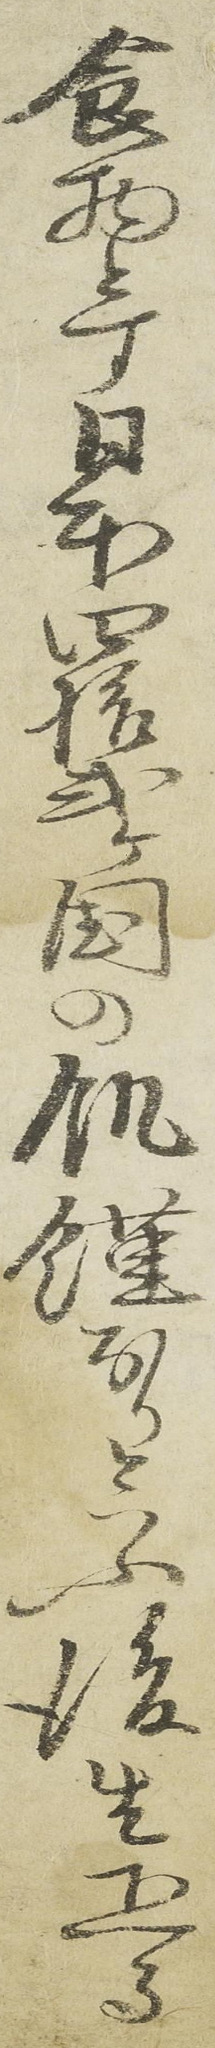食物とす日本四拾弐ケ国の飢饉なりといふ後生恐る
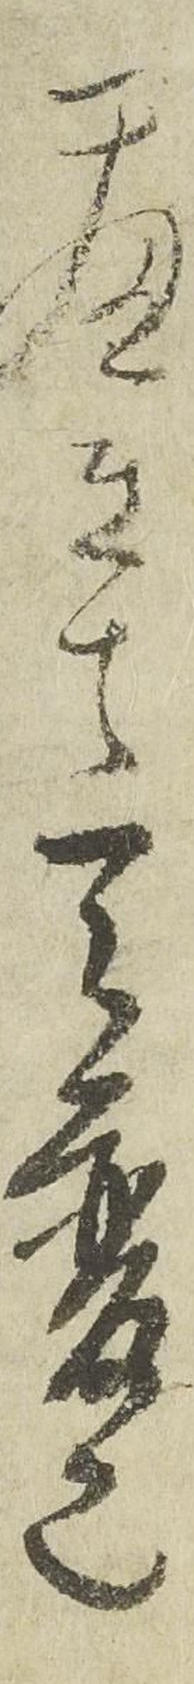べきは天変也

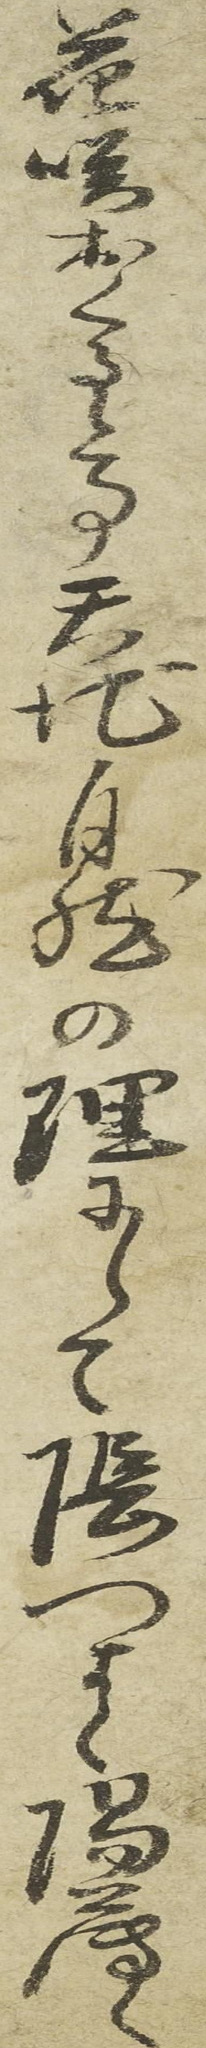花咲おくるゝ事天地自然の理にして陰つよく陽薄く
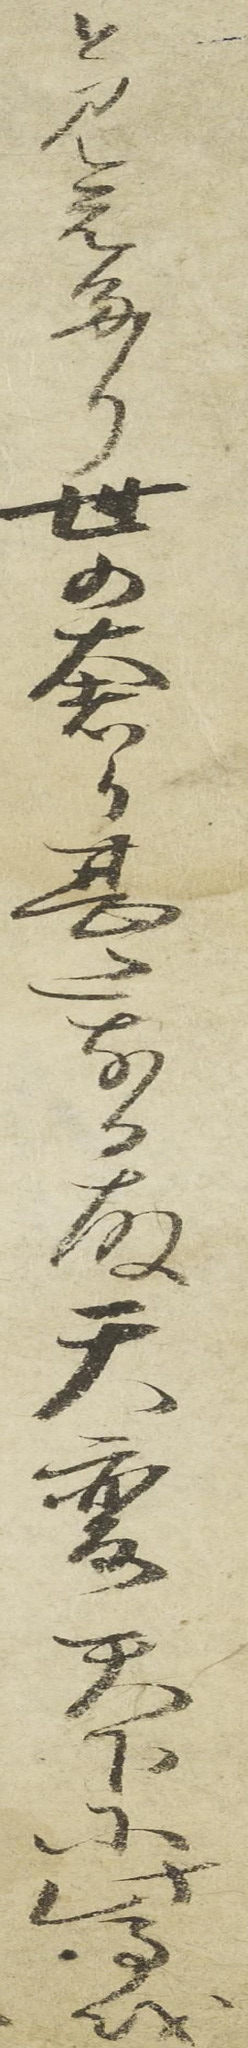と見えたり世の奢り甚たなる故天変天下に此事を
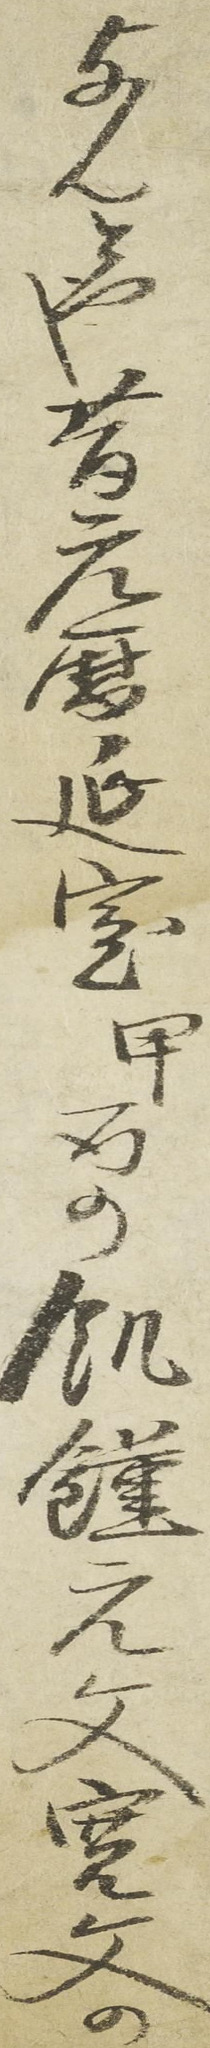与んとや昔元暦延宝甲酉の飢饉元文寛文の
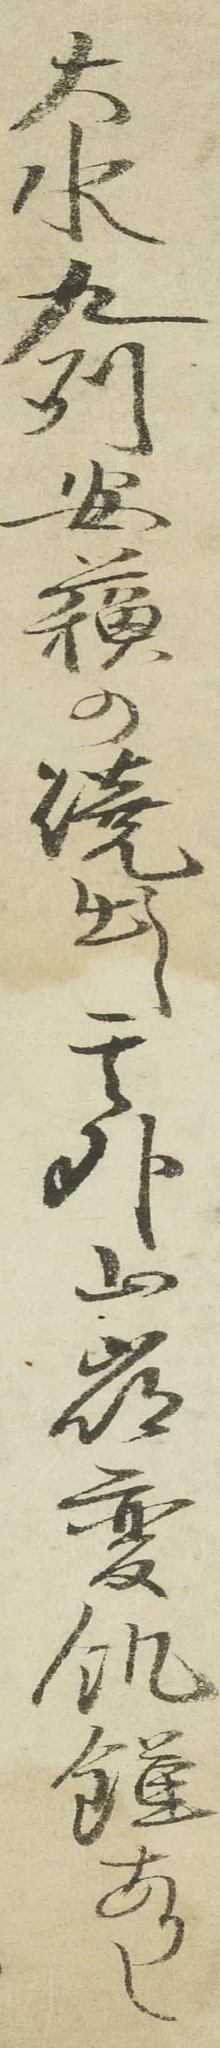大水九州安蘇の焼出し其外山崩変飢饉ありし
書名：浅間大変略記
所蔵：東京大学地震研究所図書室 Earthquake Research Institute Library, The University of Tokyo, JAPAN
